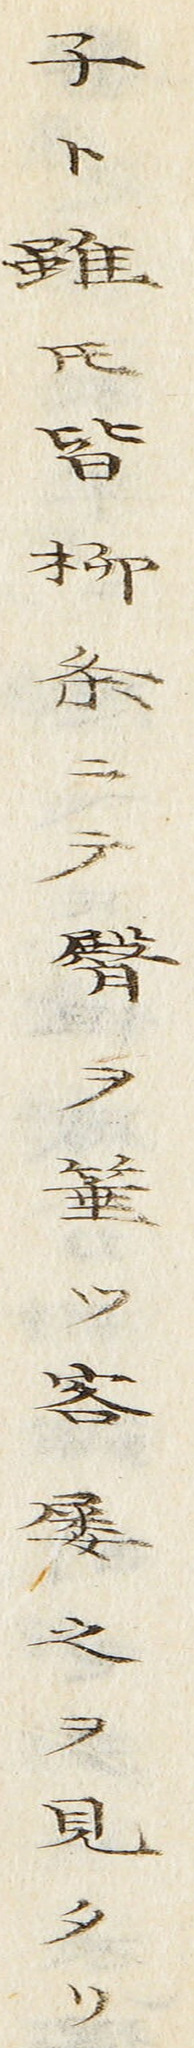子ト雖トモ皆柳条ニテ臀ヲ箠ツ客屡之ヲ見タリ
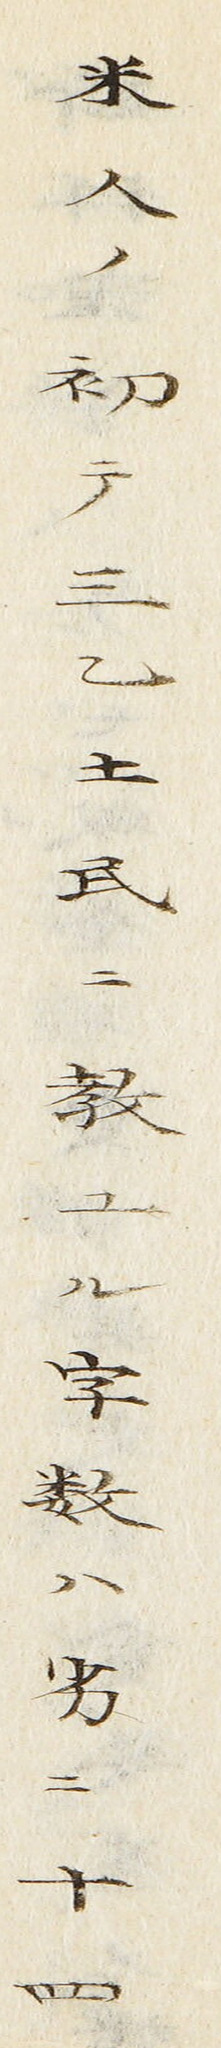〇米人ノ初テ三乙土民ニ教ユル字数ハ劣ニ十四
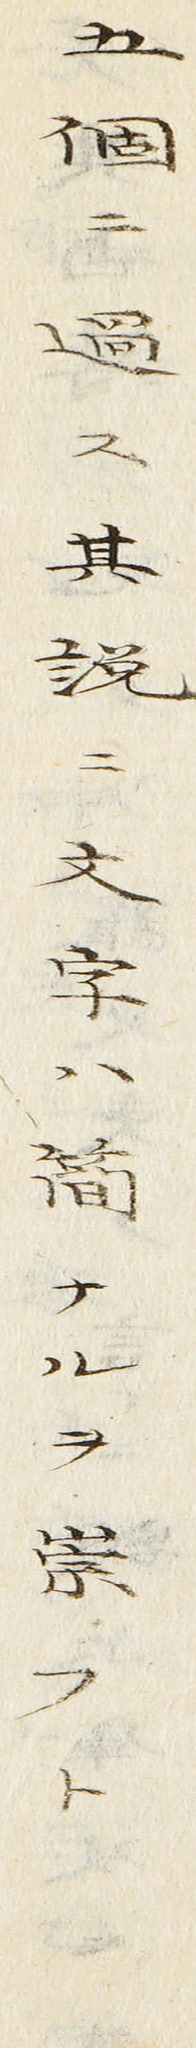五個ニ過ス其説ニ文字ハ簡ナルヲ崇フト
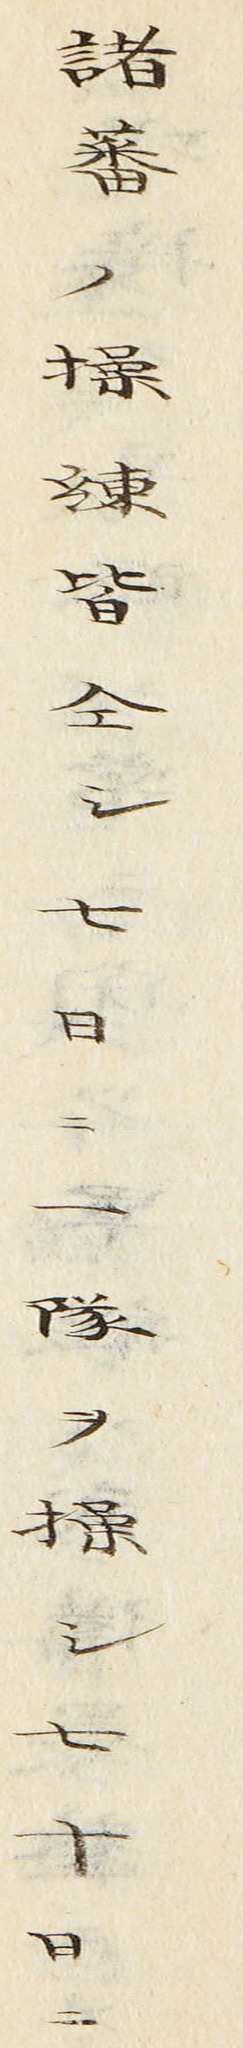〇諸蕃ノ操練皆仝七日ニ一隊ヲ操シ七十日ニ
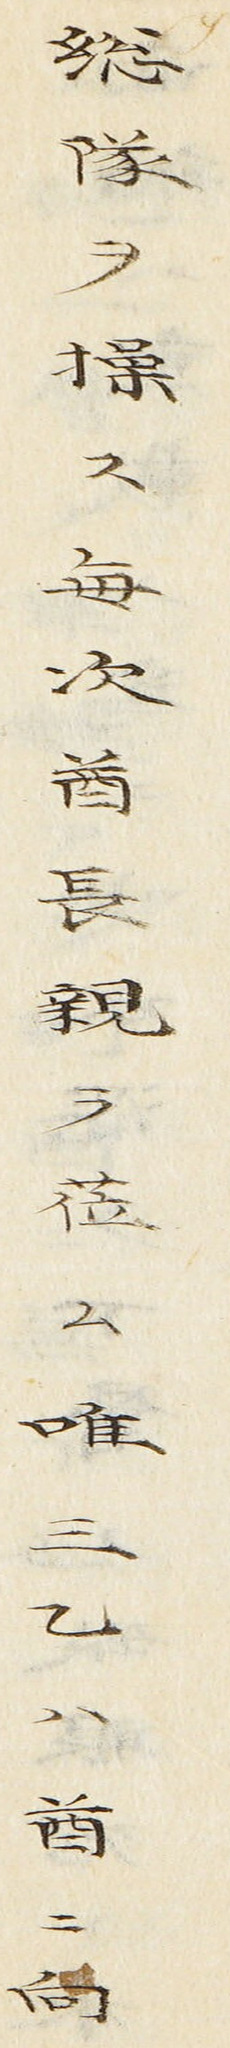総隊ヲ操ス毎次酋長親ラ莅ム唯三乙ハ酋ニ向
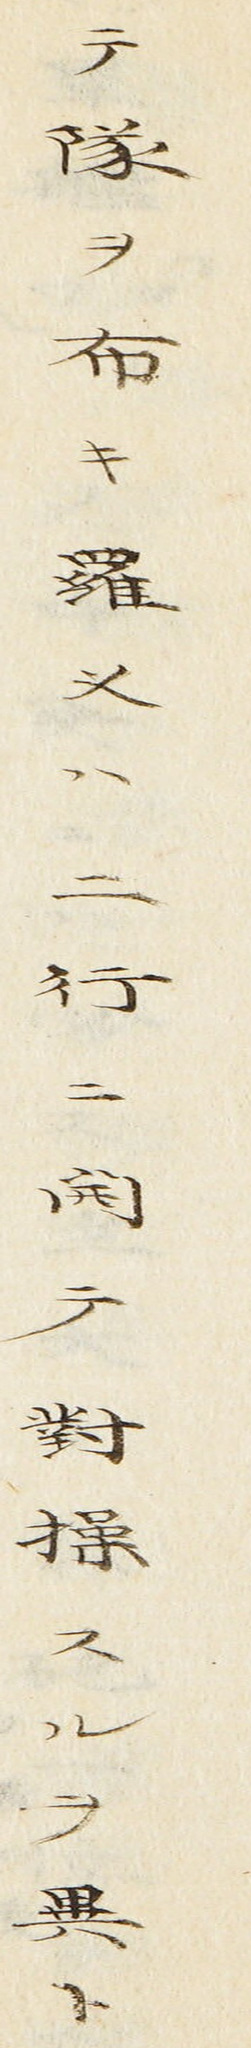テ対隊ヲ布キ羅又ハ二行ニ開テ対操スルヲ異ト
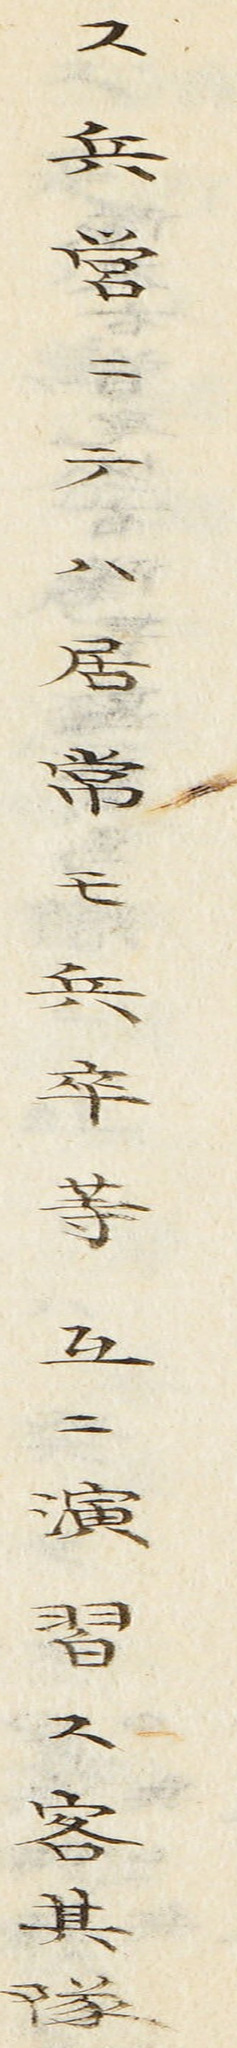ス兵営ニテハ居常モ兵卒等互ニ演習ス客其隊
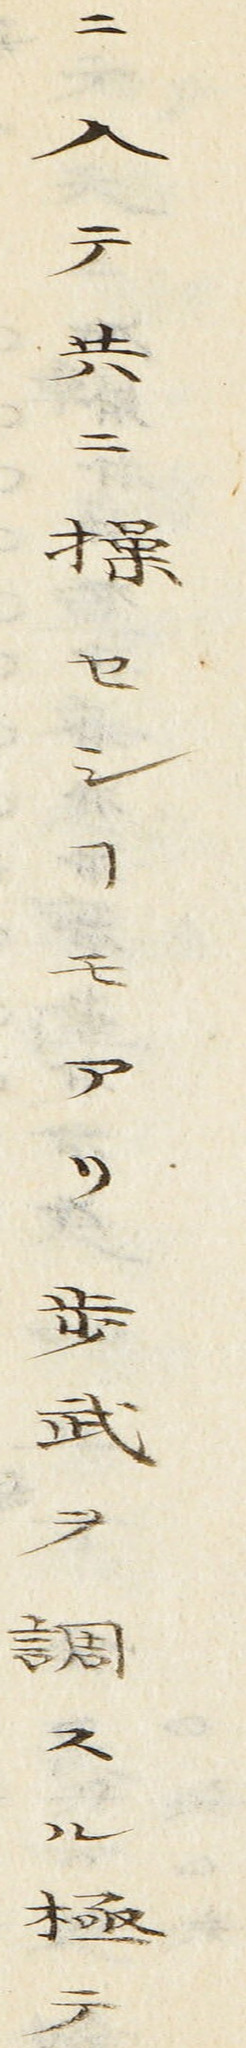ニ入テ共ニ操セシコトモアリ歩武ヲ調スル極テ
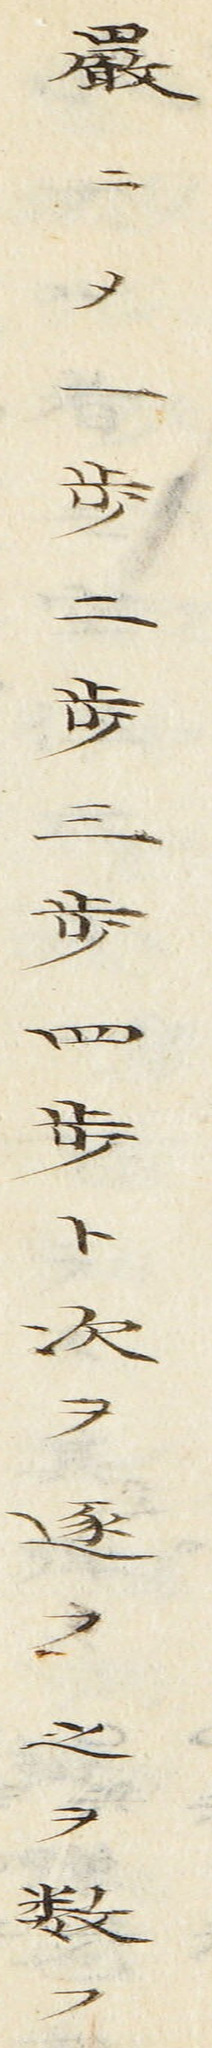厳ニシテ一歩二歩三歩四歩ト次ヲ逐フ之ヲ数フ
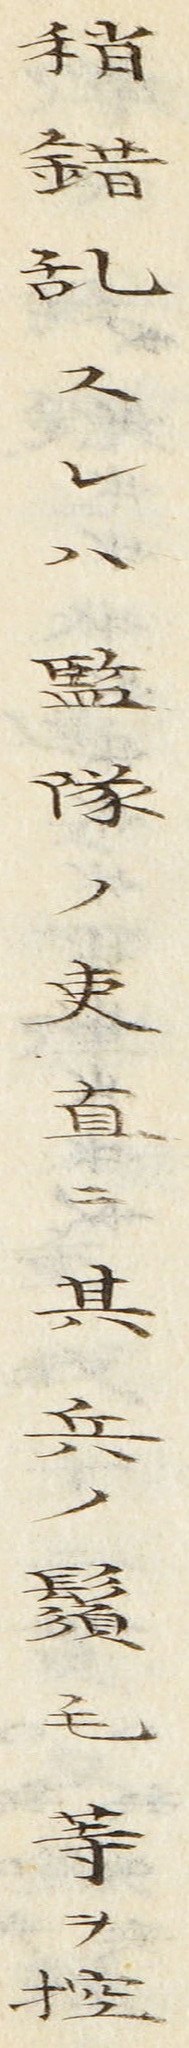稍錯乱スレハ監隊ノ吏直ニ其兵ノ鬚毛等ヲ控
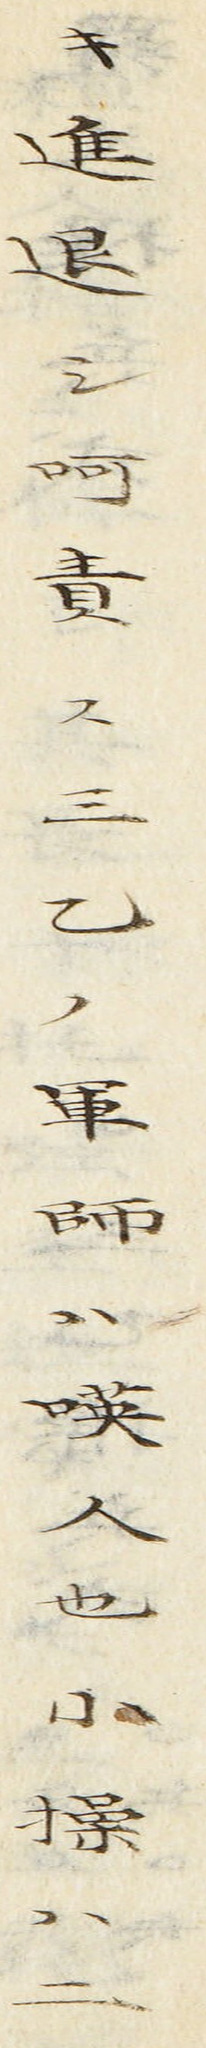キ進退シ呵責ス三乙ノ軍師ハ人也小操ハ二
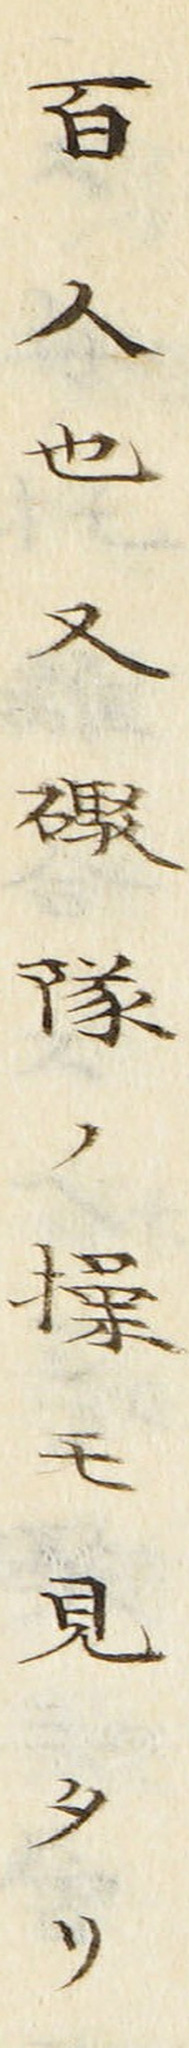百人也又礟隊ノ操モ見タリ

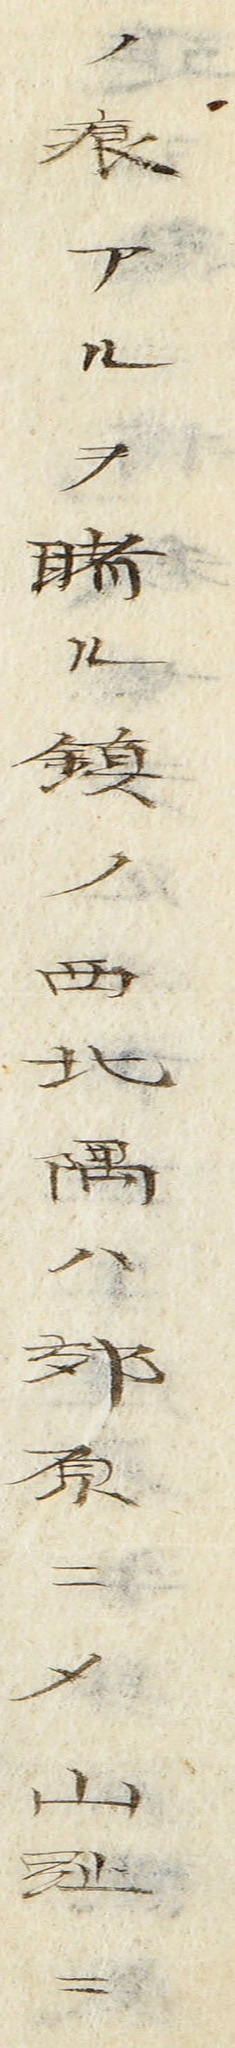ノ痕アルヲ睹ル鎮ノ西北隅ハ郊原ニシテ山趾ニ
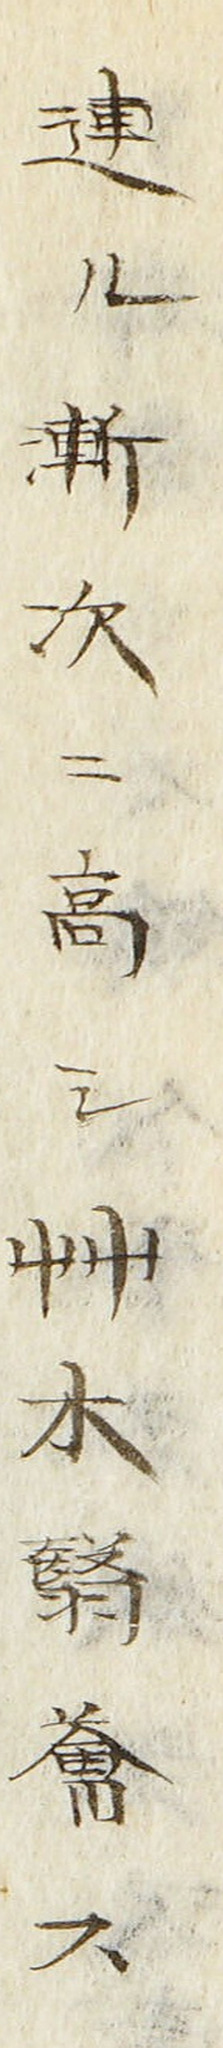連ル漸次ニ高シ草木翳薈ス
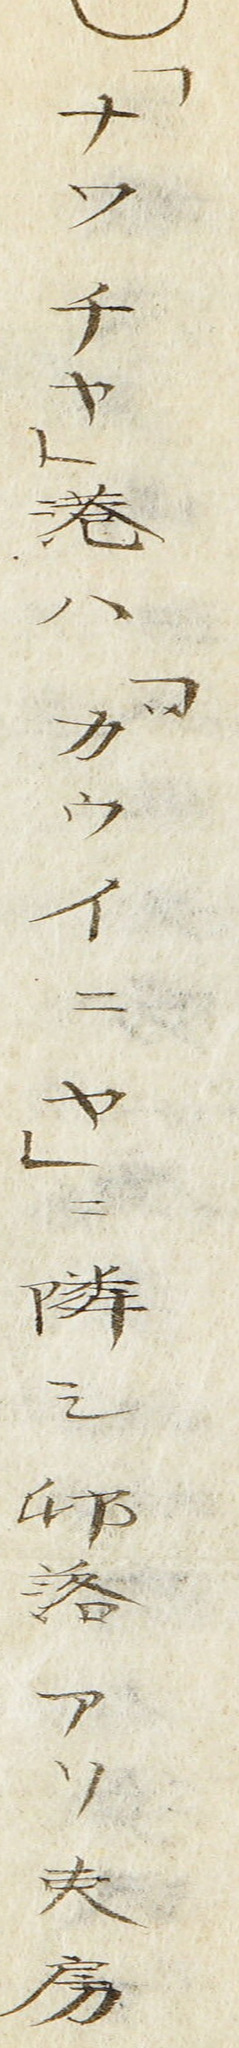〇「ナワチヤ」港ハ「ガウイニヤ」ニ隣シ邨落アリ吏房
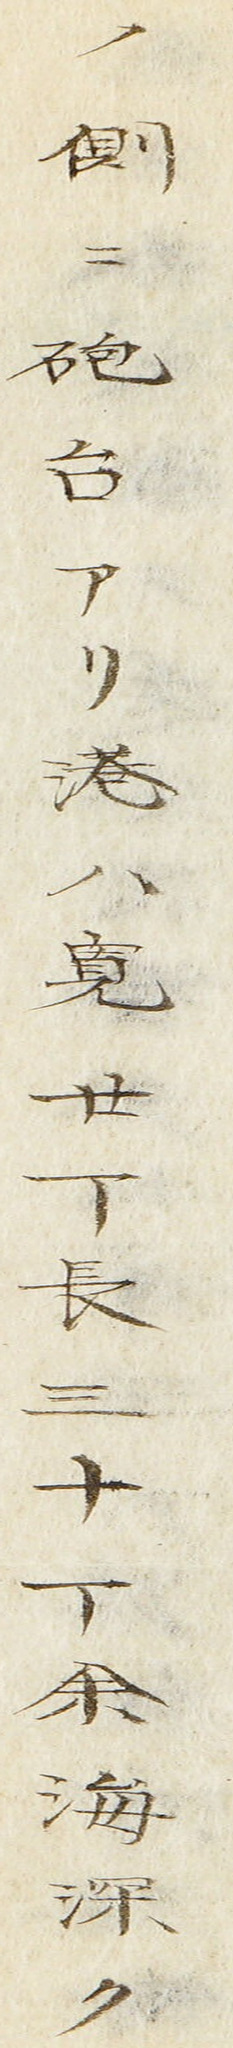ノ側ニ砲台アリ港ハ寛廿丁長三十丁余海深ク
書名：蕃談
